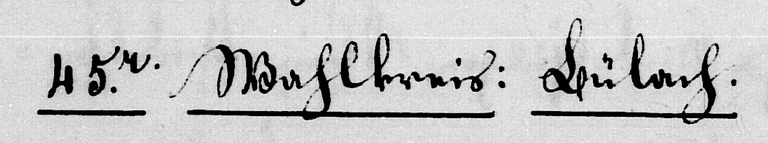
45.r. Wahlkreis: Bülach.
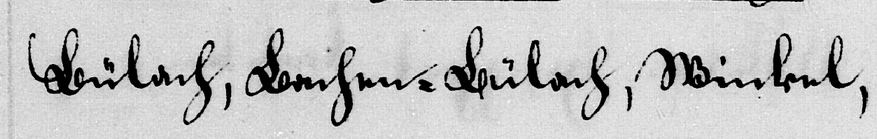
Bülach, Bachen-Bülach, Winkel,
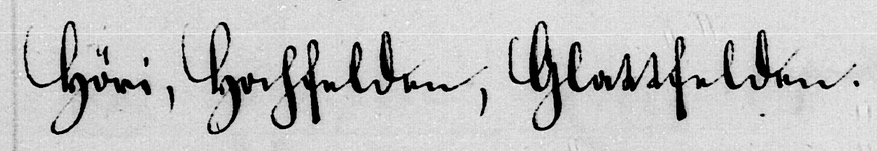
Höri, Hochfelden, Glattfelden.
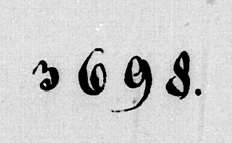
3698.
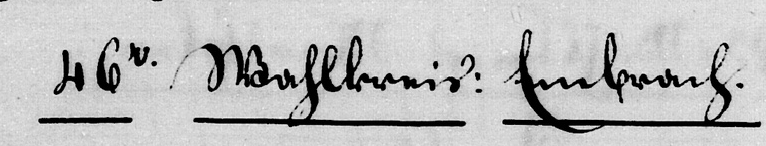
46.r. Wahlkreis: Embrach.
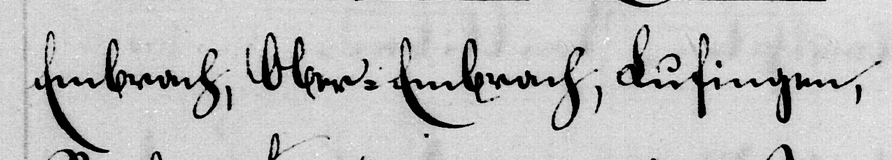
Embrach, Ober-Embrach, Lufingen,
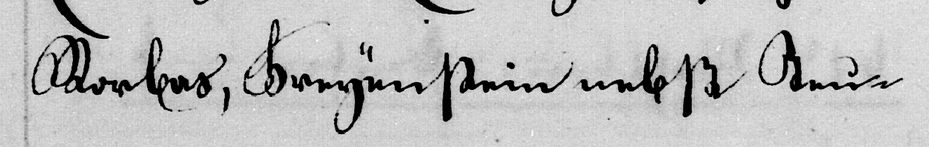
Rorbas, Freyenstein nebst Teu¬
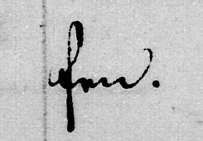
fen.
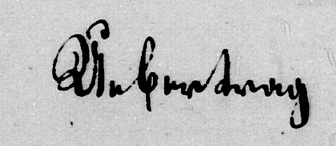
Uebertrag.
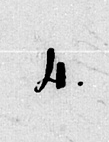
4.
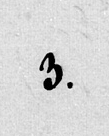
3.
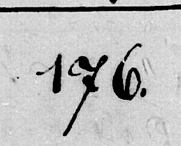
160.
